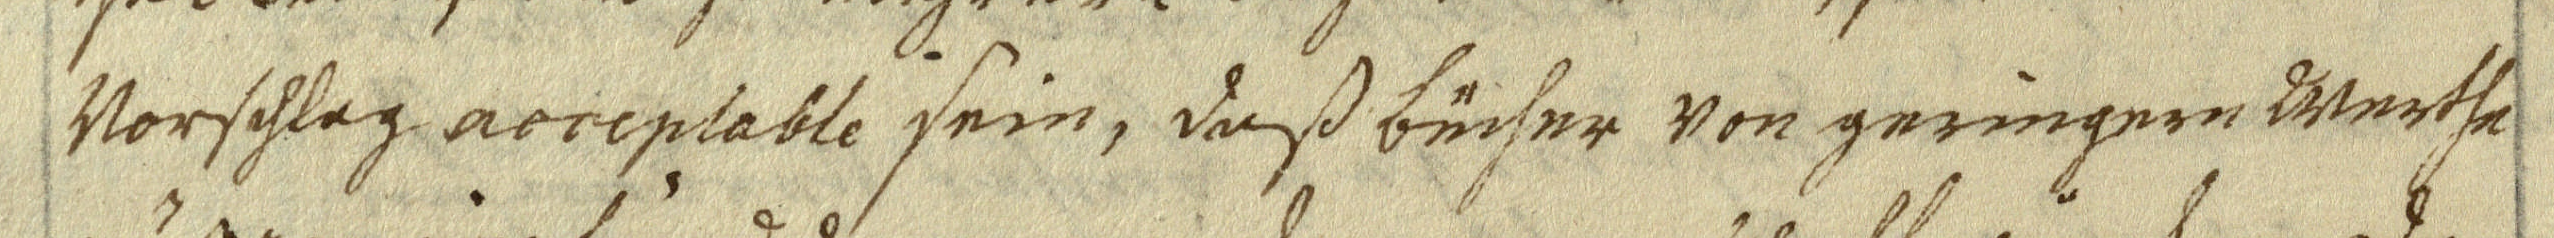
Vorschlag acceptable sein, daß Bücher von geringern Werthe
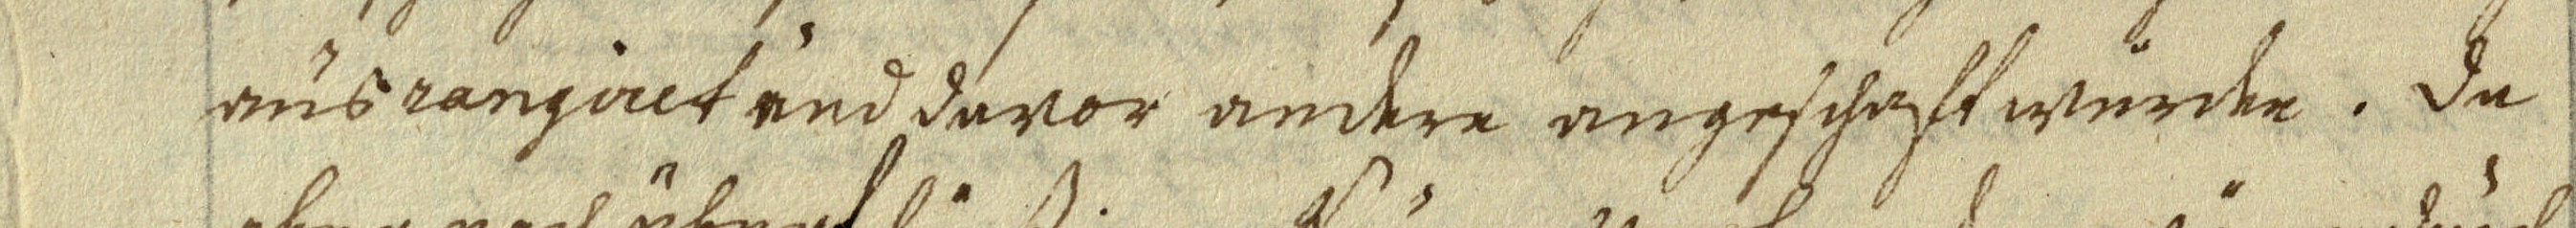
ausrangiret und davor andere angeschaft würden. Da
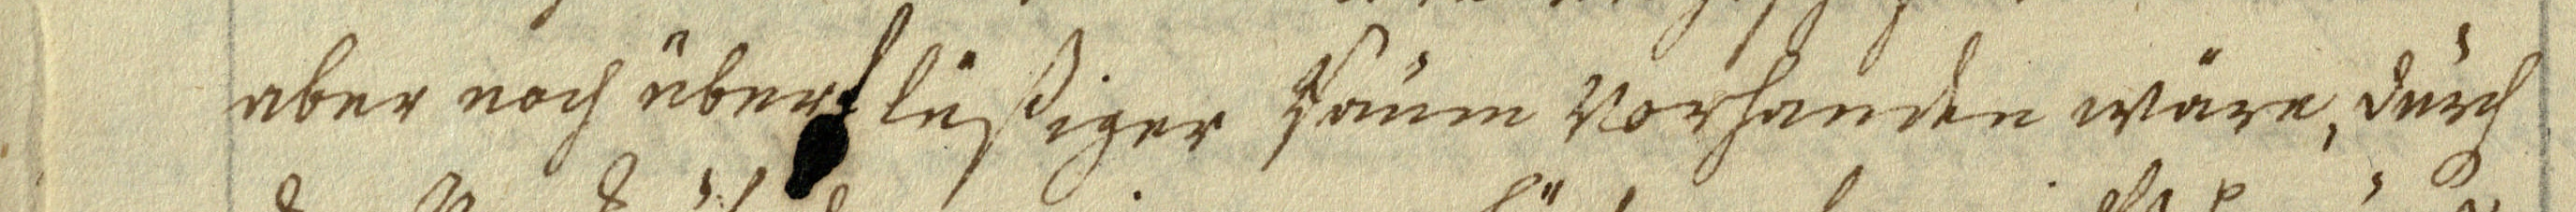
aber noch überflüßiger Raum vorhanden wäre, durch
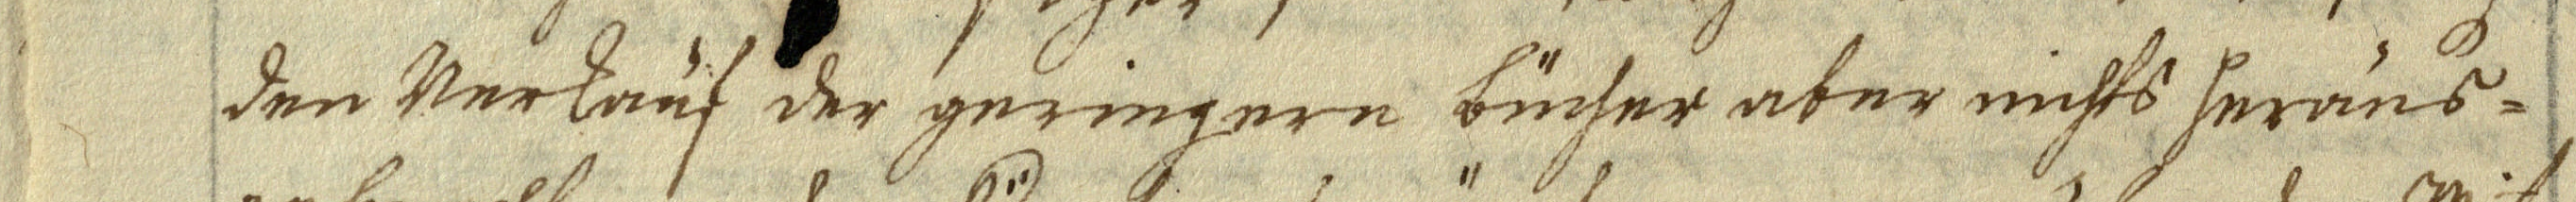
den Verkauf der geringern Bücher aber nichts heraus¬
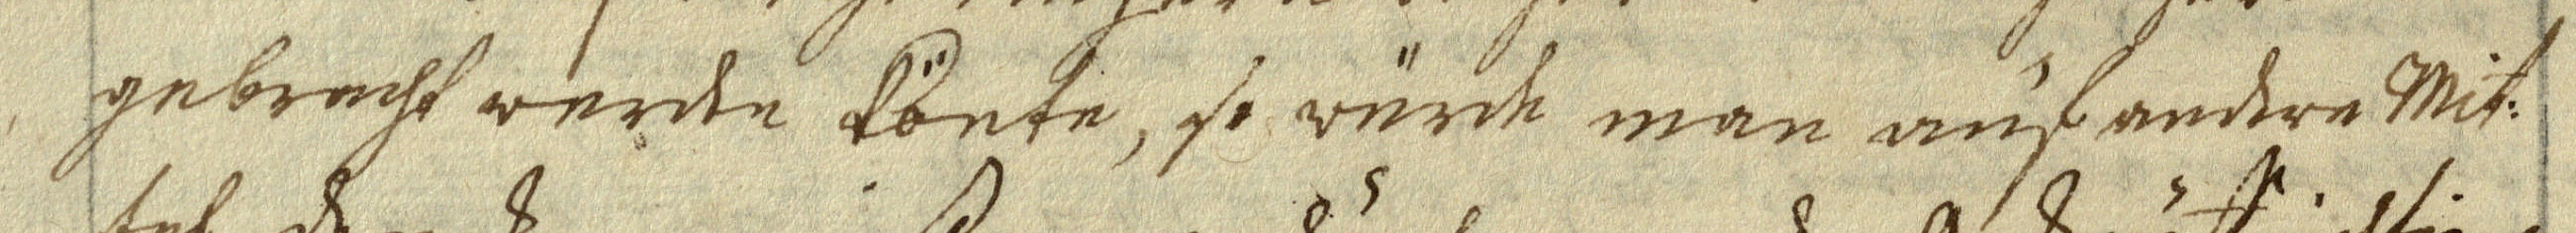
gebracht werden könte, so würde man auf andere Mit¬
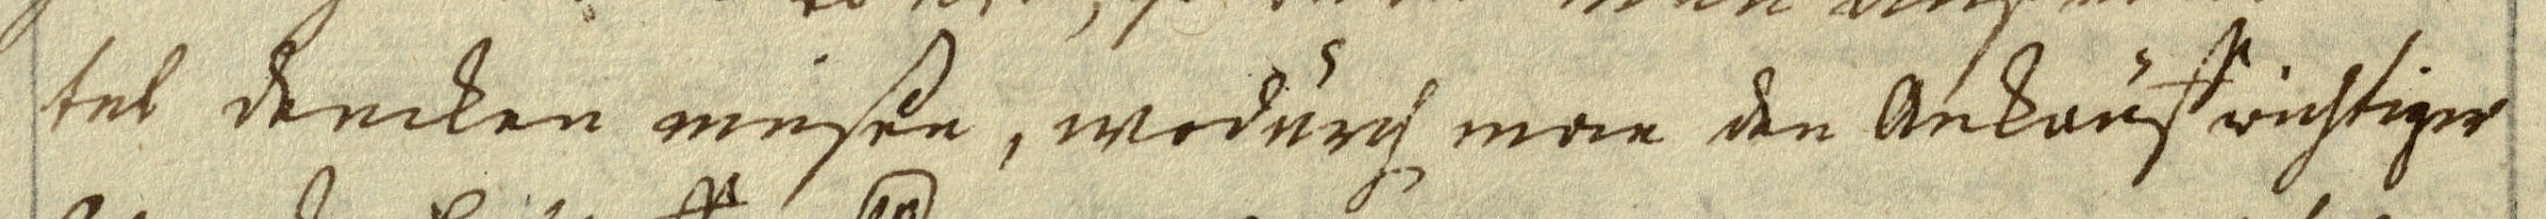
tel dencken müßen, wodurch man den Ankauf wichtiger
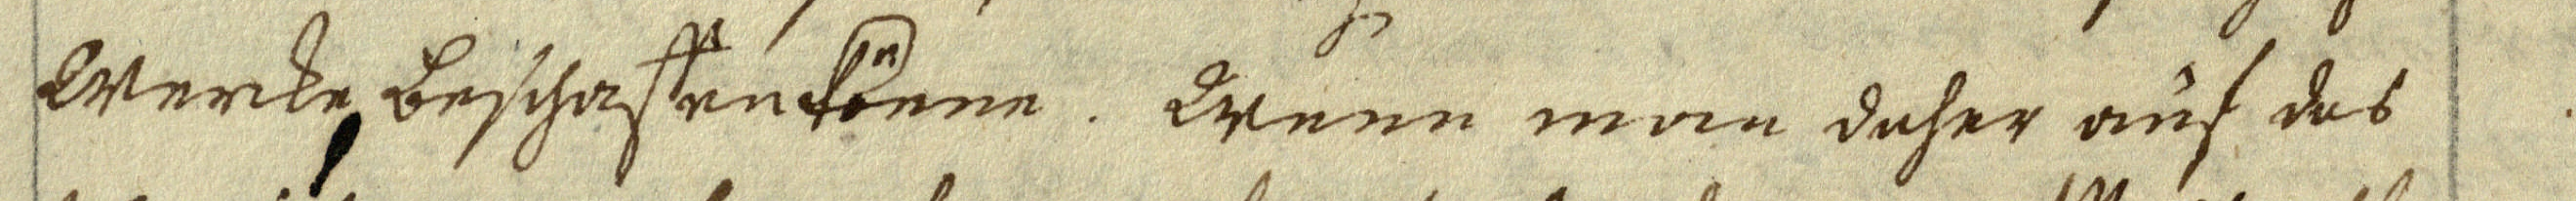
Wercke beschaffen könne. Wenn man daher auf das
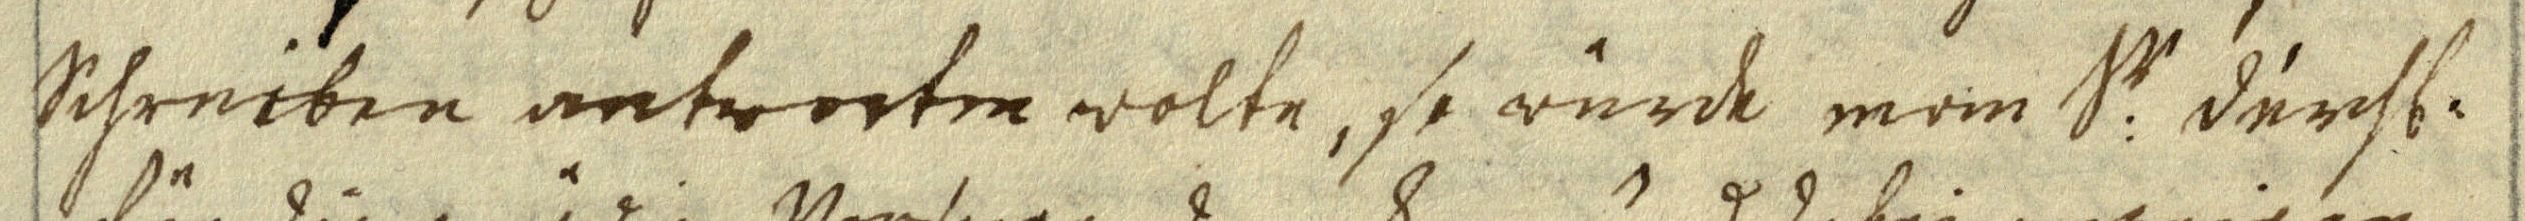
Schreiben antworten wolte, so würde man Sr. Durchl.
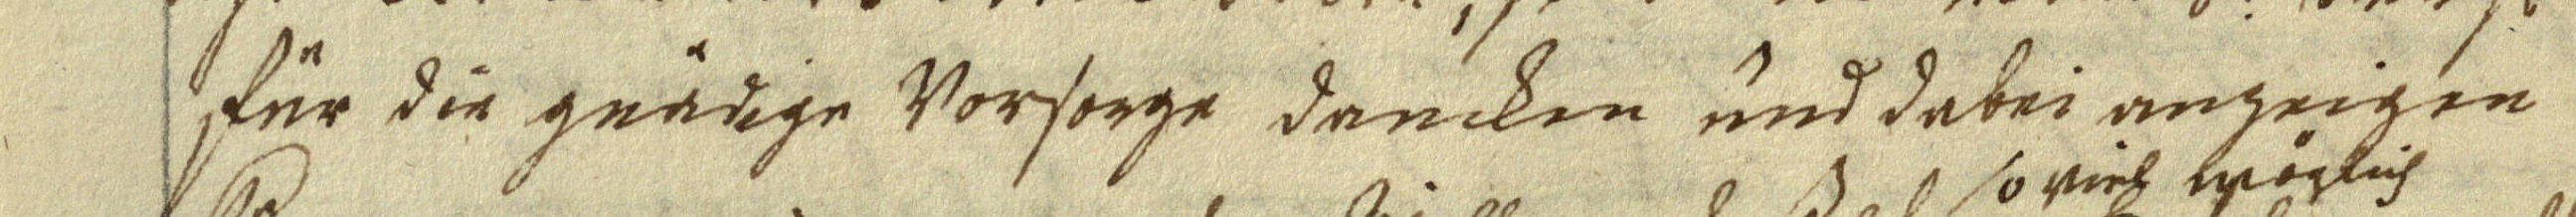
für die gnädige Vorsorge dancken und dabei anzeigen
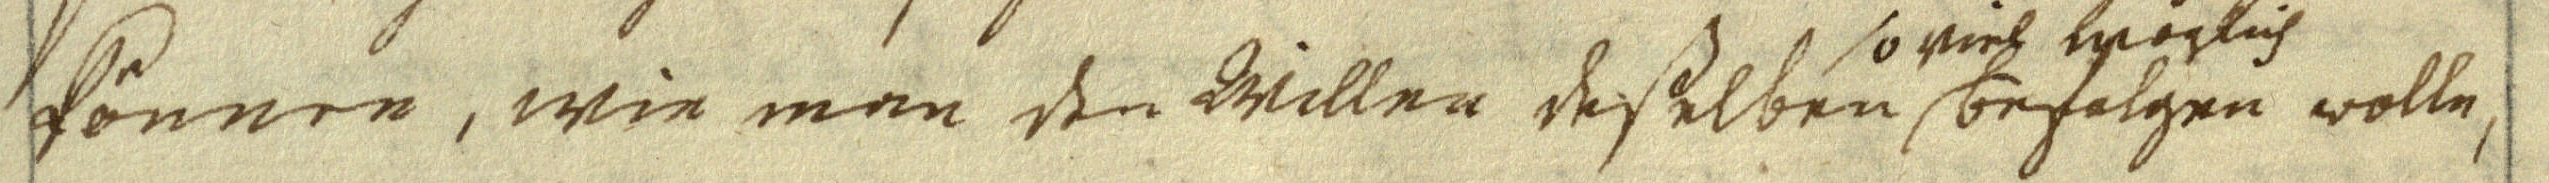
können, wie man den Willen deßelben so viel möglich befolgen wolle,
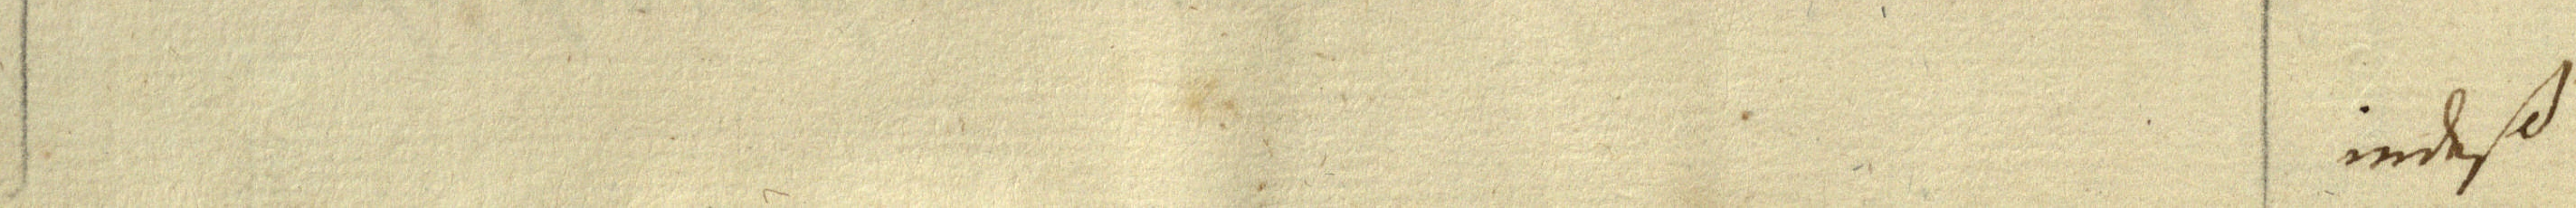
indeß
